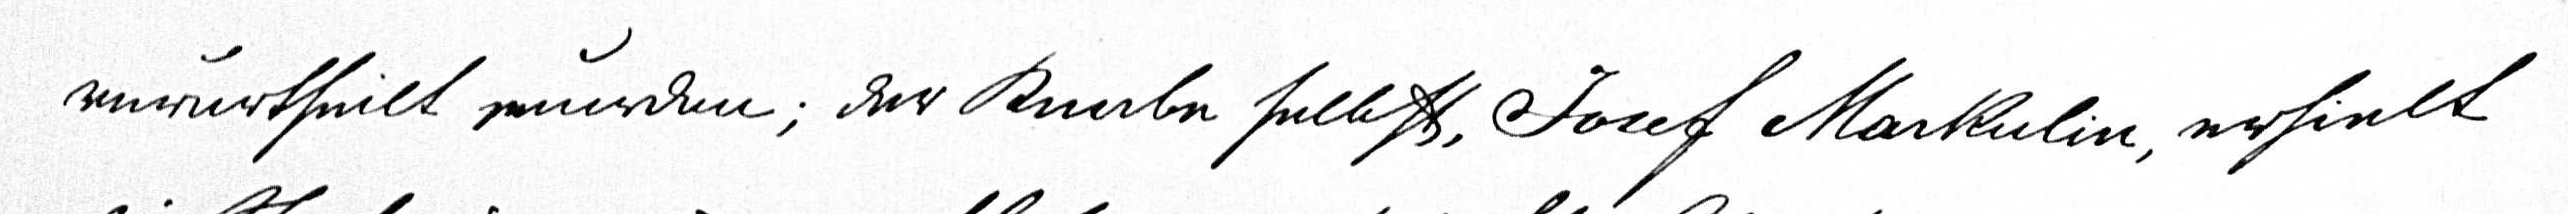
verurtheilt wurden; der Knabe selbst, Josef Markulin, erhielt
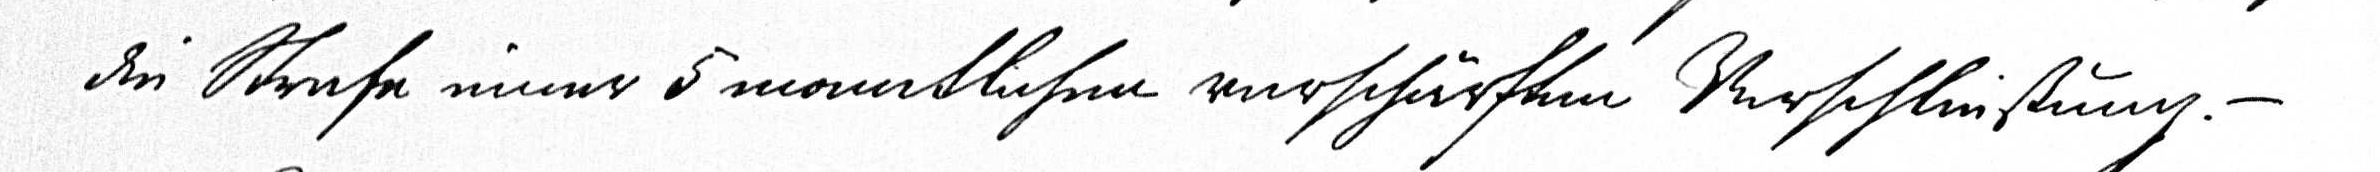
die Strafe einer 5 monatlichen verschärften Verschließung.-
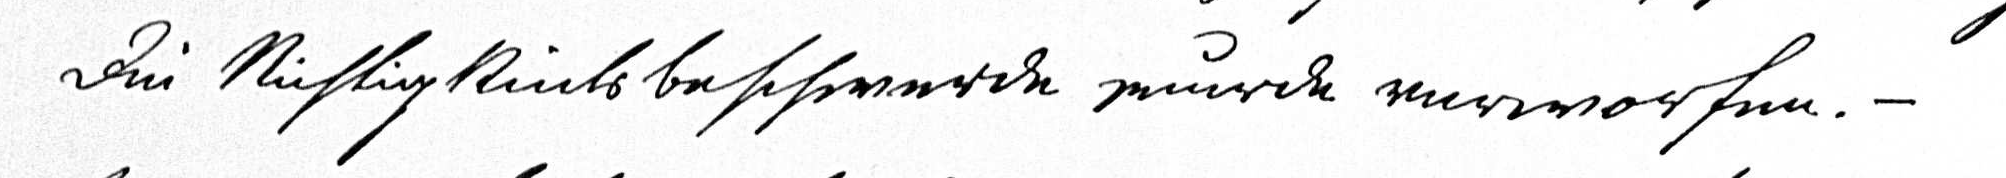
Die Nichtigkeitsbeschwerde wurde verworfen.-
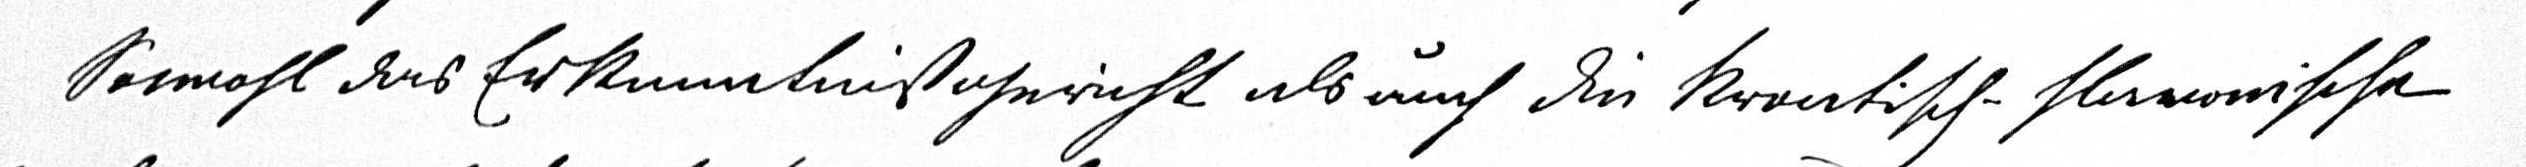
Sowohl das Erkenntniß Gericht als auch die kroatisch-slavonische
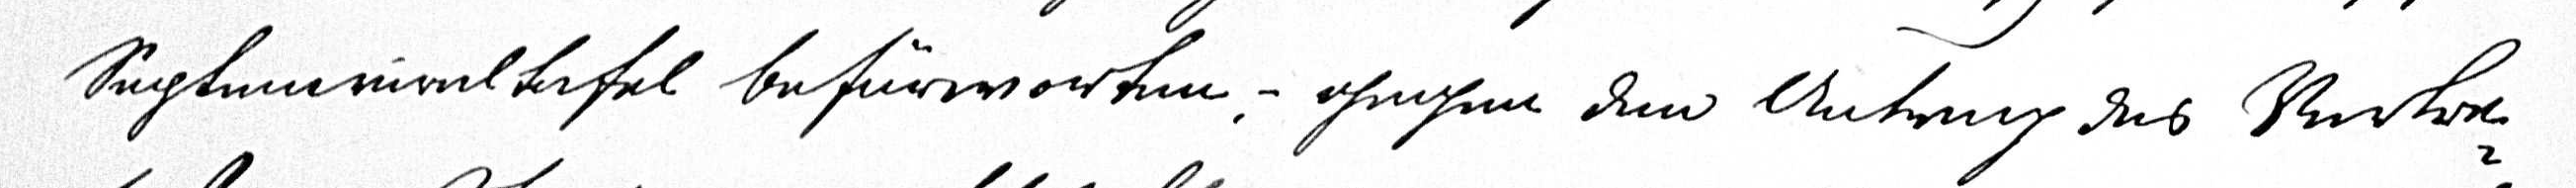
Septemviraltafel befürworten.- gegen den Antrag des Vertre¬
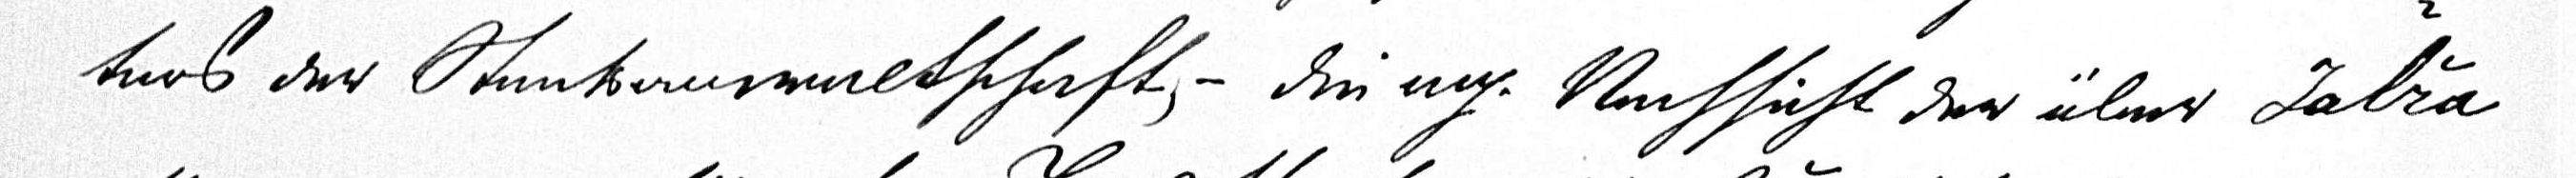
ters der Staatsanwaltschaft, - die ag. Nachsicht der über Jalža
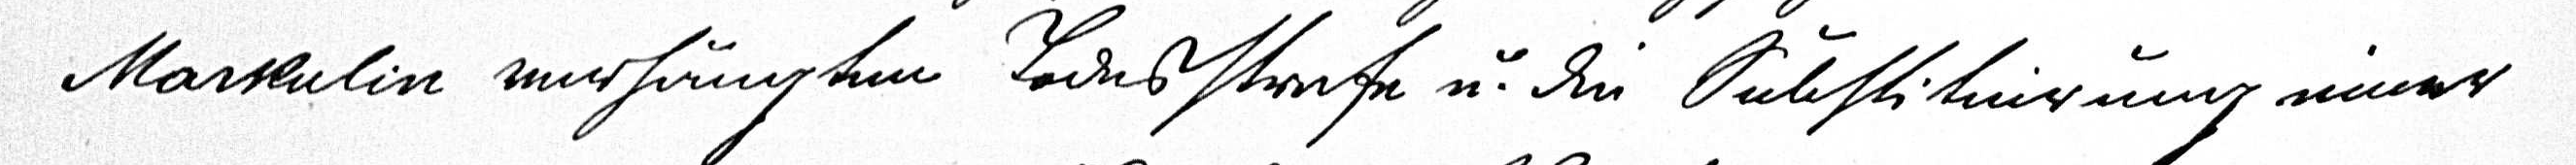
Markulin verhängten Todesstrafe u. die Substituirung einer
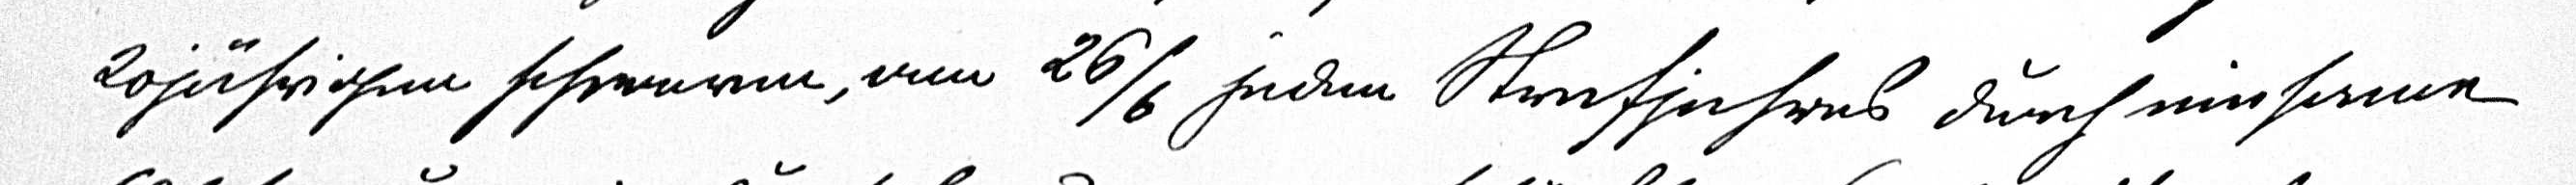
20jährigen schweren, am 26/6 jeden Strafjahres durch einsame
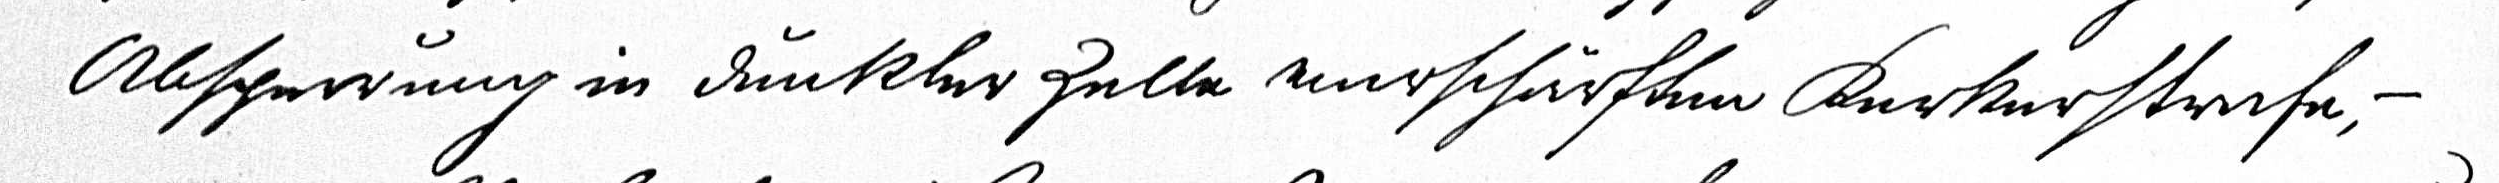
Absperrung in dunkler Zelle verschärften Kerkerstrafe,-
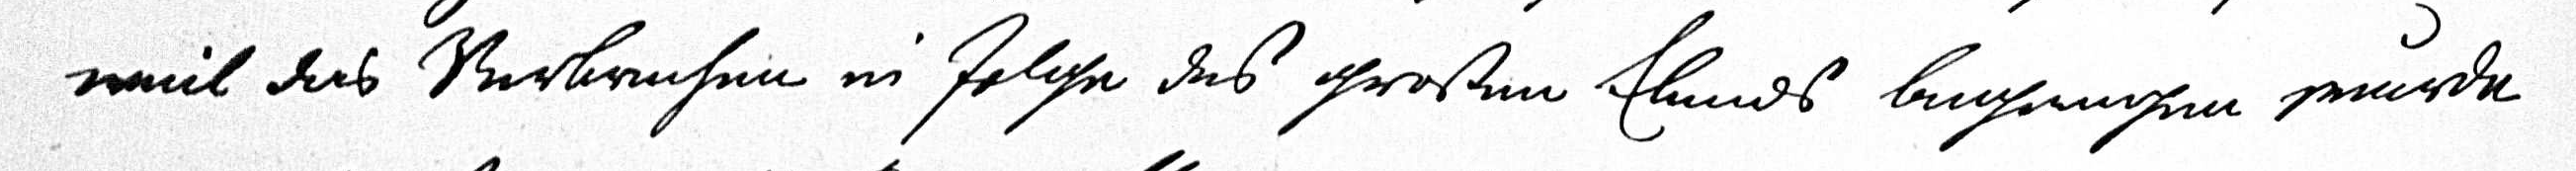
weil das Verbrechen in Folge des großen Elends begangen wurde
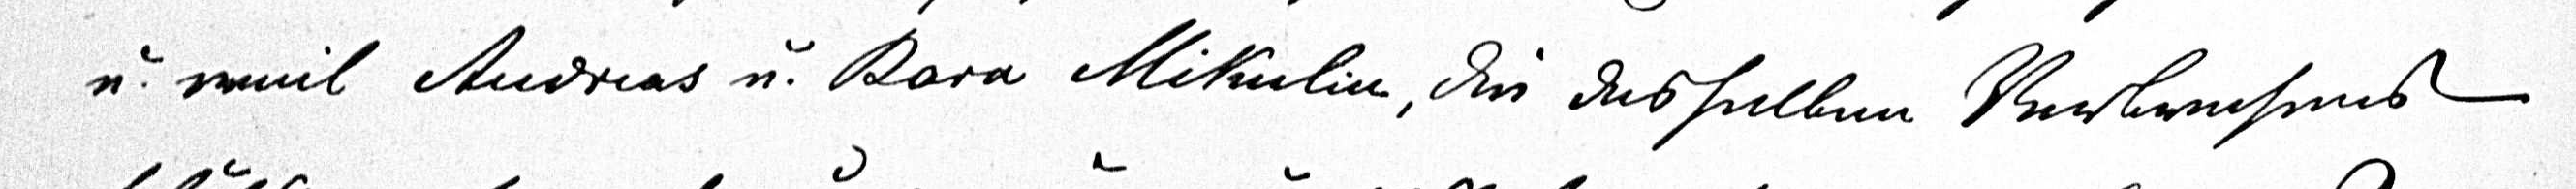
u. weil Andreas u. Bara Mikulin, die desselben Verbrechens
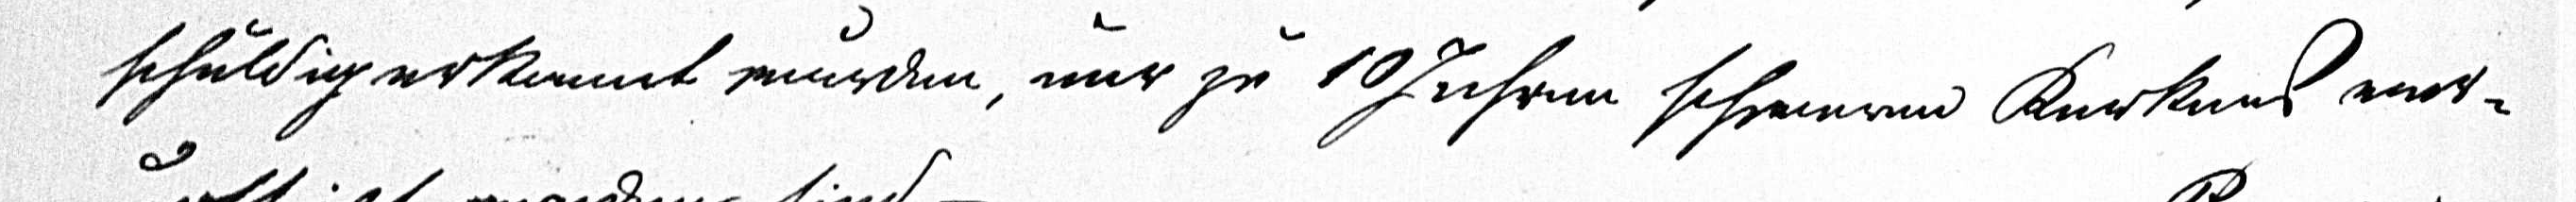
schuldig erkannt wurden, nur zu 10 Jahren schweren Kerkers ver¬
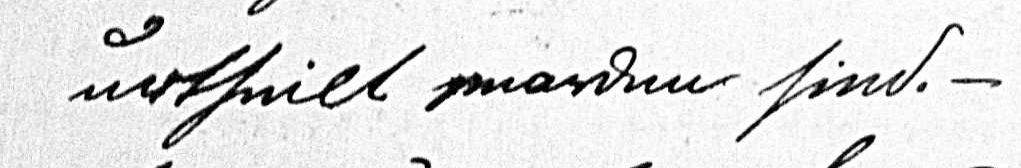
urtheil worden sind.-
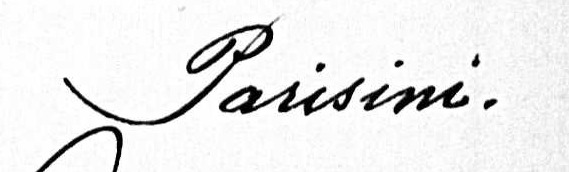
Parisini.
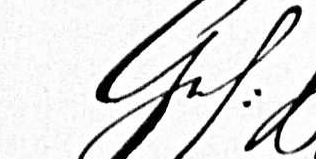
Ges:
